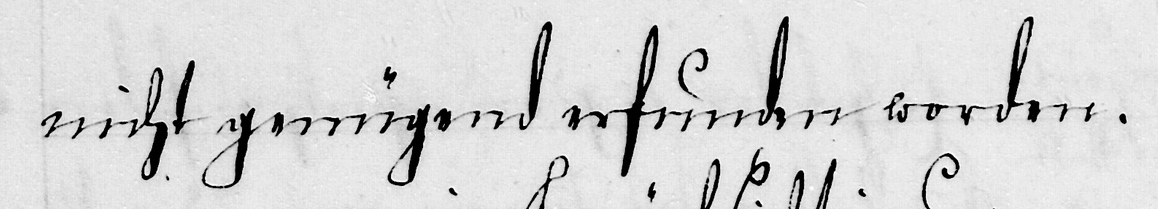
nicht genügend erfunden worden.
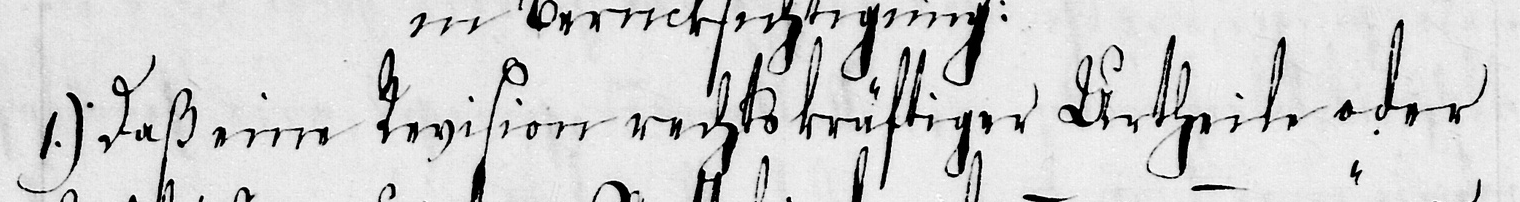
1.) Daß eine Revision rechtskräftiger Urtheile oder
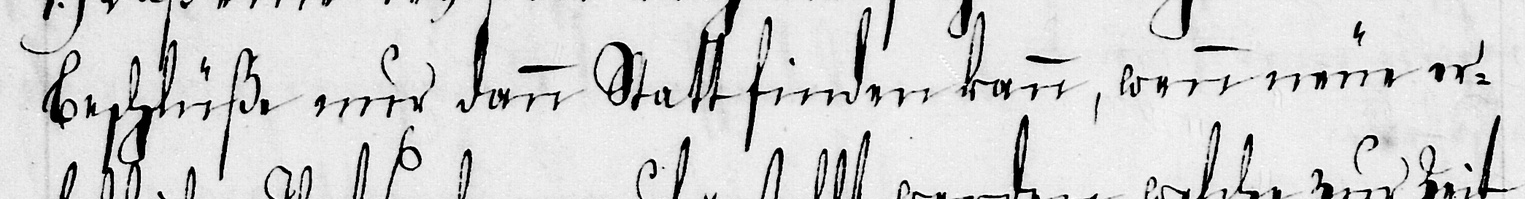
Beschlüße nur dann Statt finden kann, wenn neue er¬
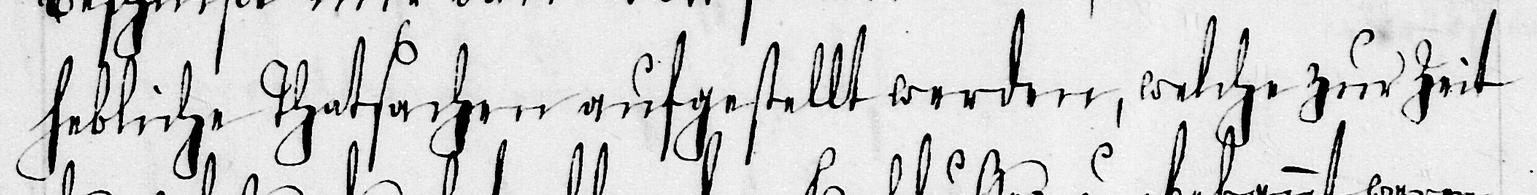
hebliche Thatsachen aufgestellt werden, welche zur Zeit
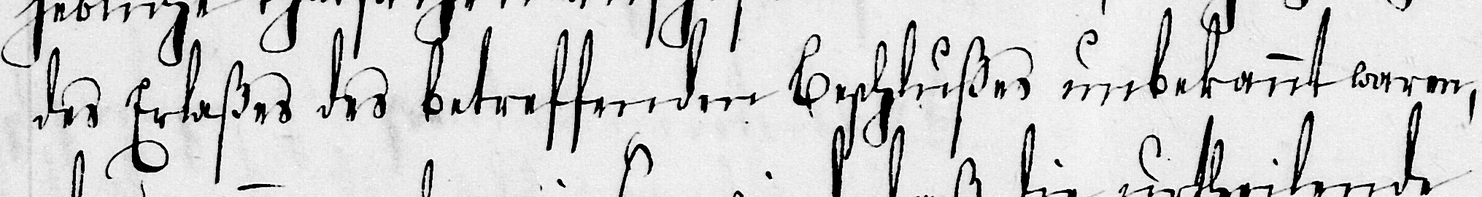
des Erlaßes des betreffenden Beschlußes unbekannt waren,
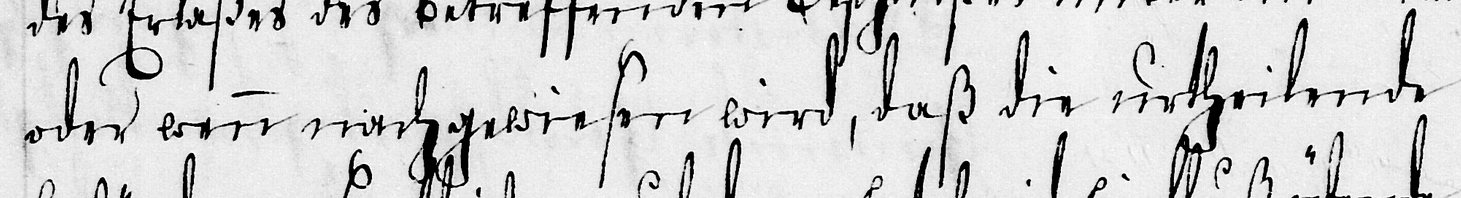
oder wenn nachgewiesen wird, daß die urtheilende
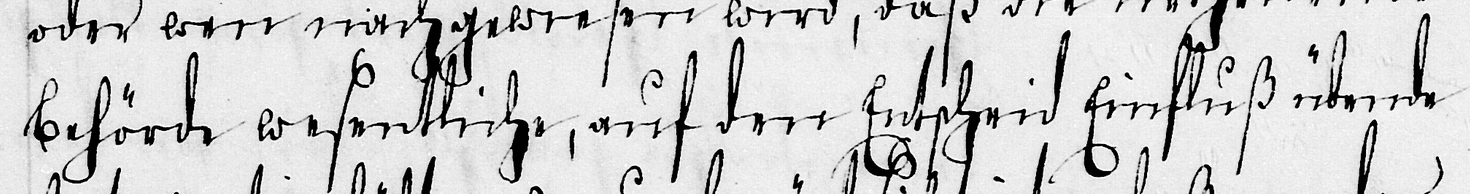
Behörde wesentliche, auf den Entscheid Einfluß übende
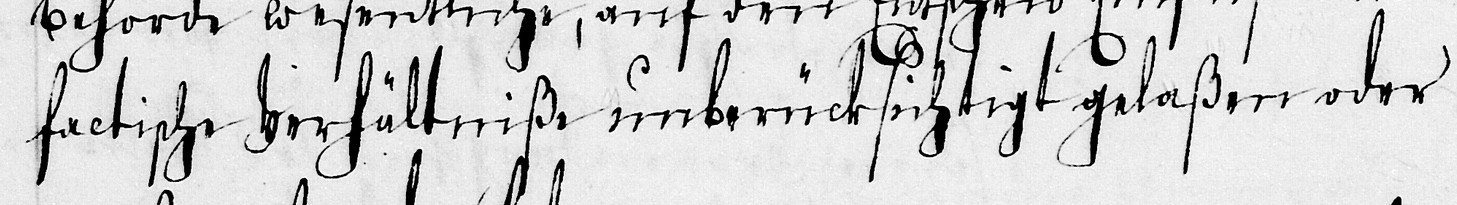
factische Verhältniße unberücksichtigt gelaßen oder
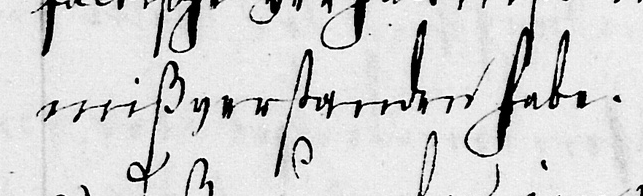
mißverstanden habe.
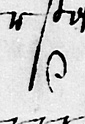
1.
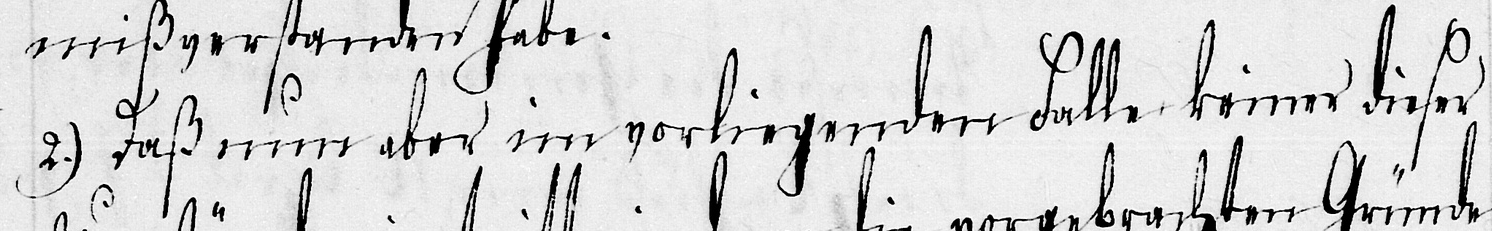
2.) Daß nun aber im vorliegenden Falle keiner dieser
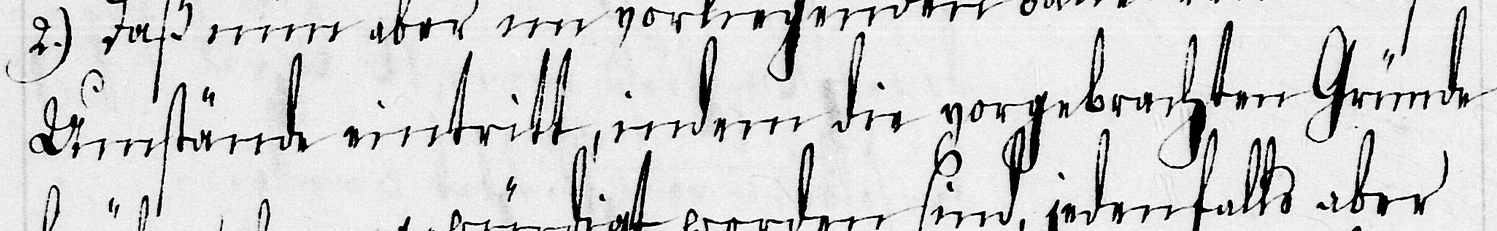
Umstände eintritt, indem die vorgebrachten Gründe
